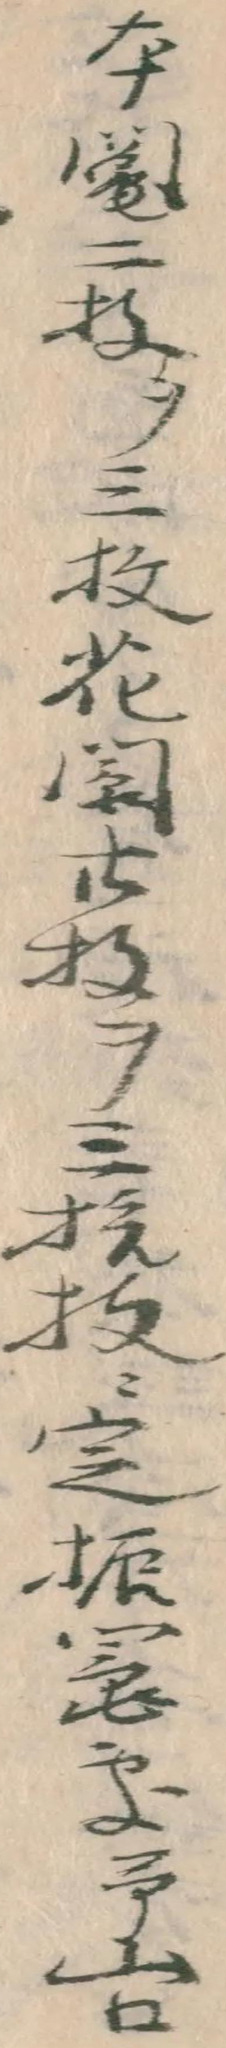本鬮二枚を三枚花鬮廿枚を三拾枚に定振鬮処予山口
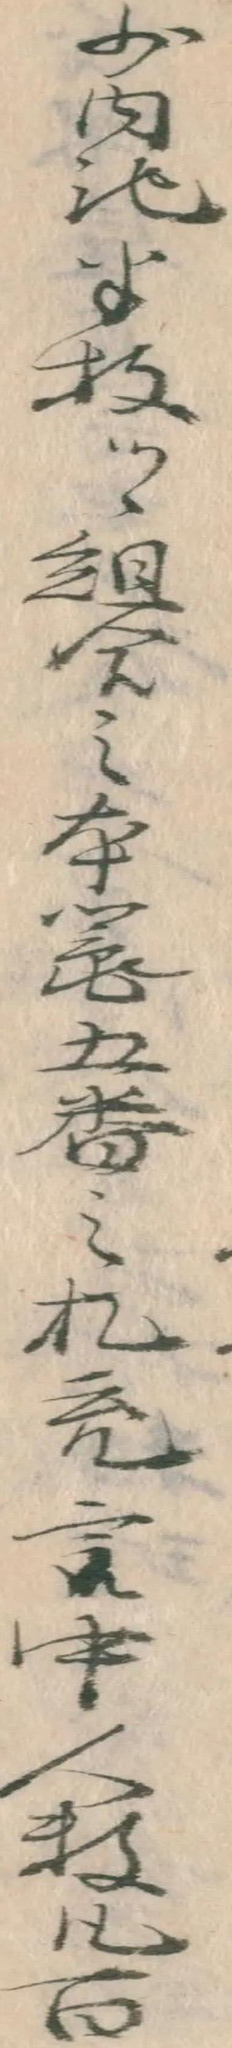少内記半枚ツヽ組合之本鬮五番之札充最中人数凡百
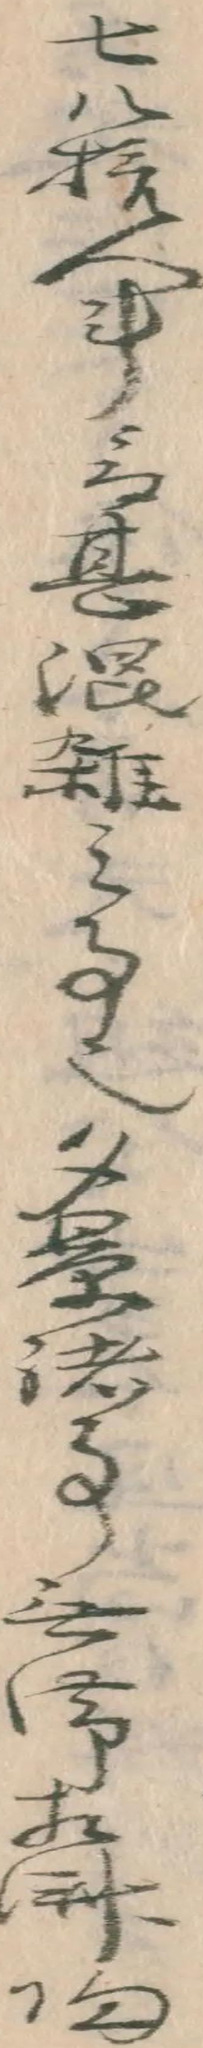七八拾人斗ニ而甚混雑之事也夕景諸事無滞相済帰
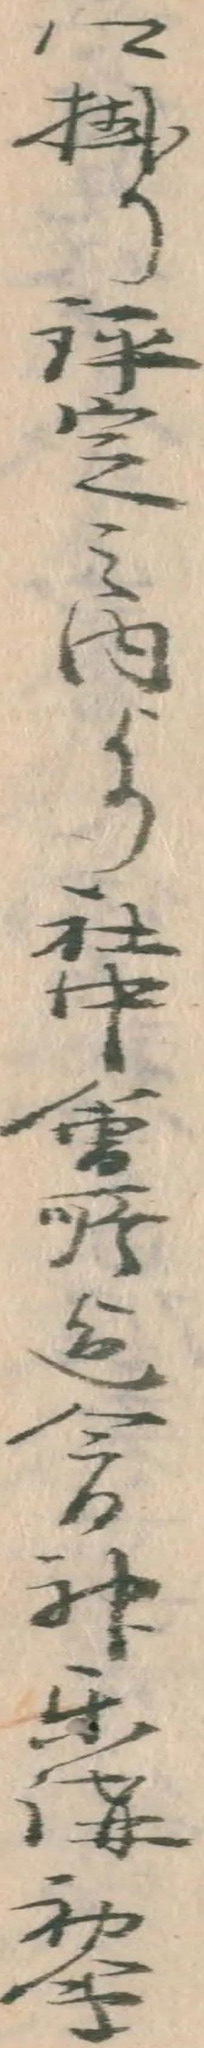郷掛り評定之内より社中会所迄今日神楽講初会
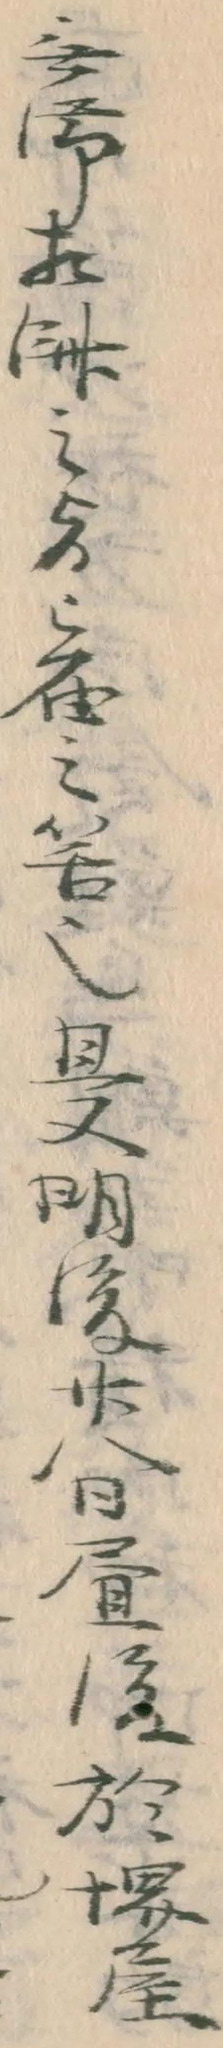無滞相済之旨被届之筈也且又明後廿八日昼後於堺屋
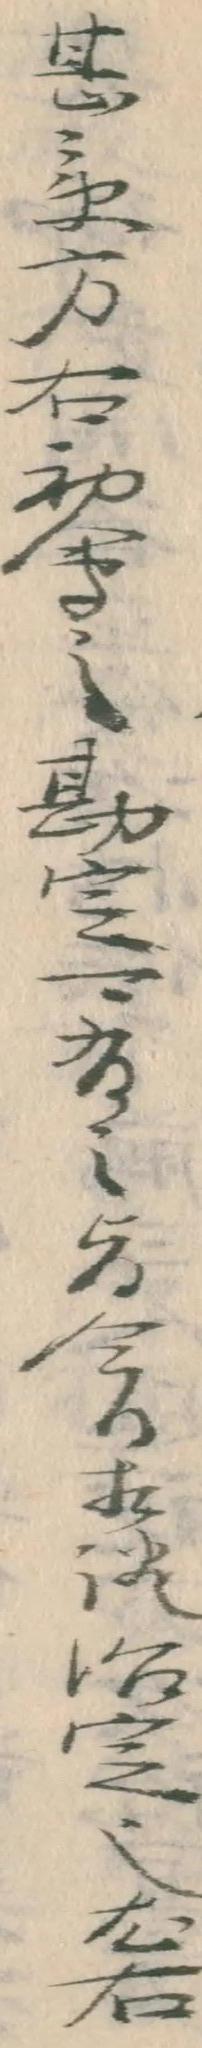甚兵衛方右初会之勘定可有之旨今日相談治定也尤右
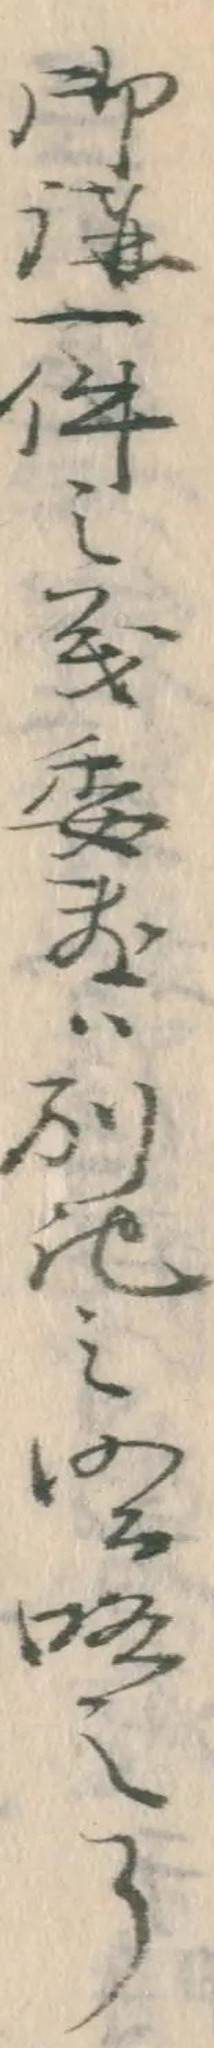御講一件之義委敷ハ別記之仍而略之了
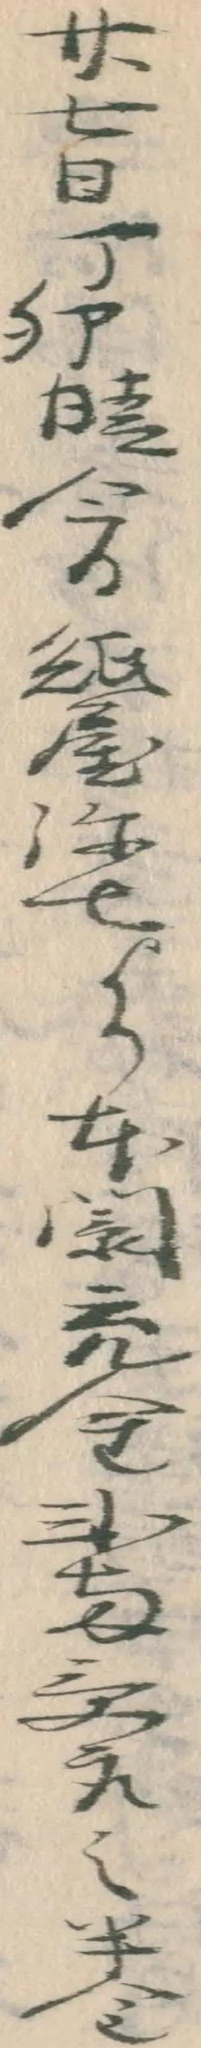廿七日丁卯晴今日紙屋弥七より本鬮充金弐両受取之半金
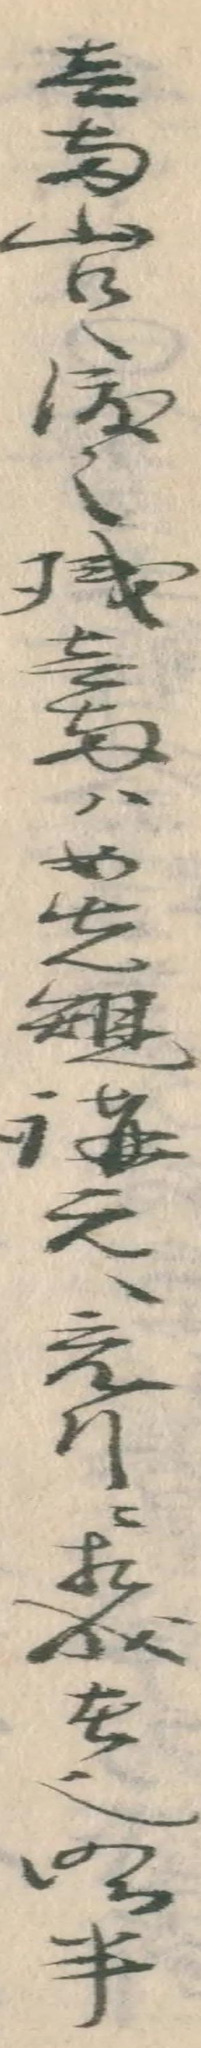壱両山口へ渡之残壱両ハ御先規講元へ充引ニ相成者也仍而半
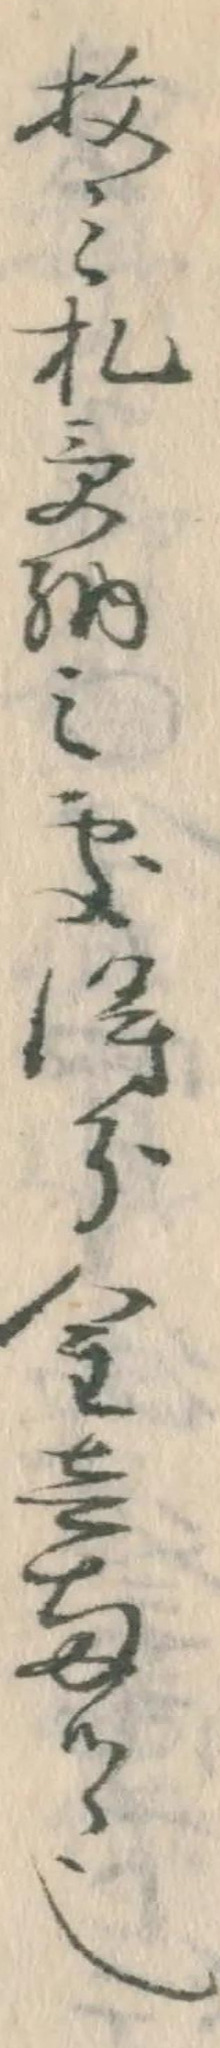枚之札受納之処得分金壱両つゝ也
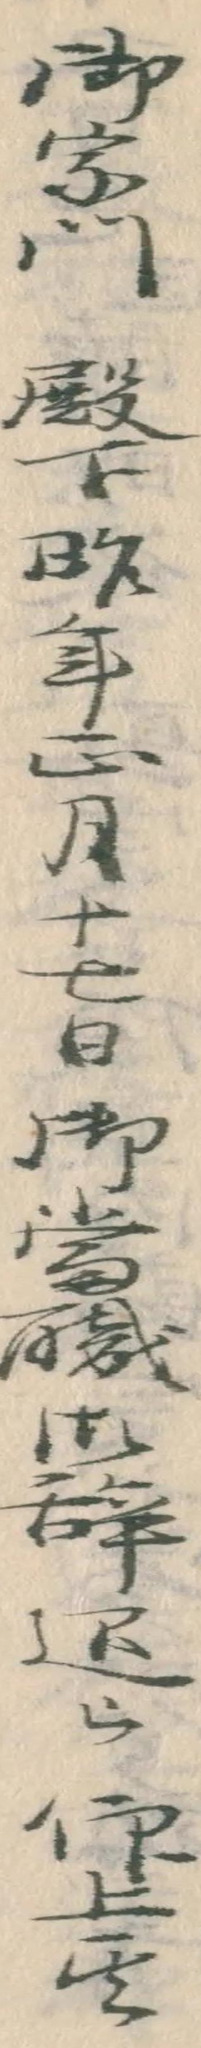御家門殿下昨年正月十七日御当職御辞退被仰上其
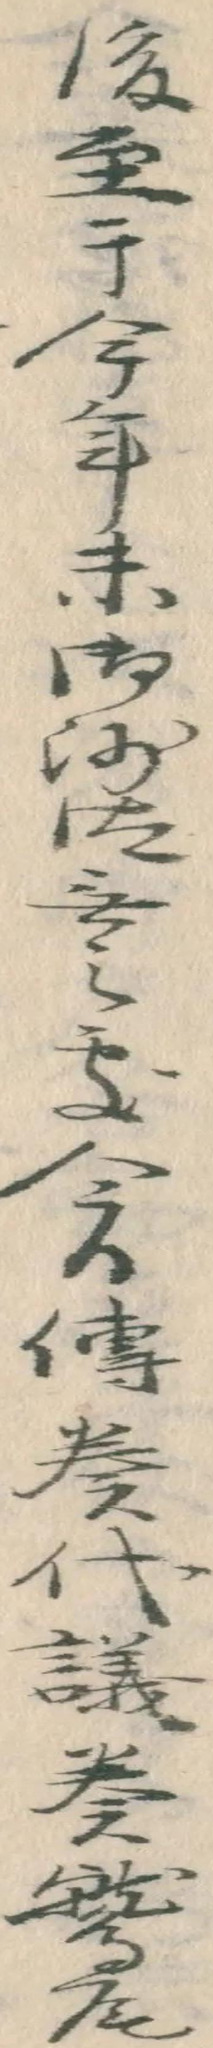後至于今年未御沙汰無之処今日伝奏代議奏鷲尾
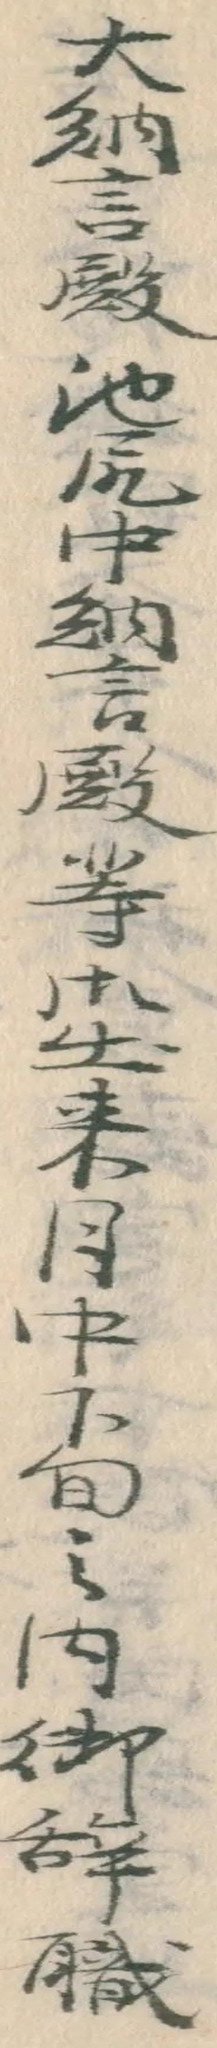大納言殿池尻中納言等御出来月中下旬之内御辞職
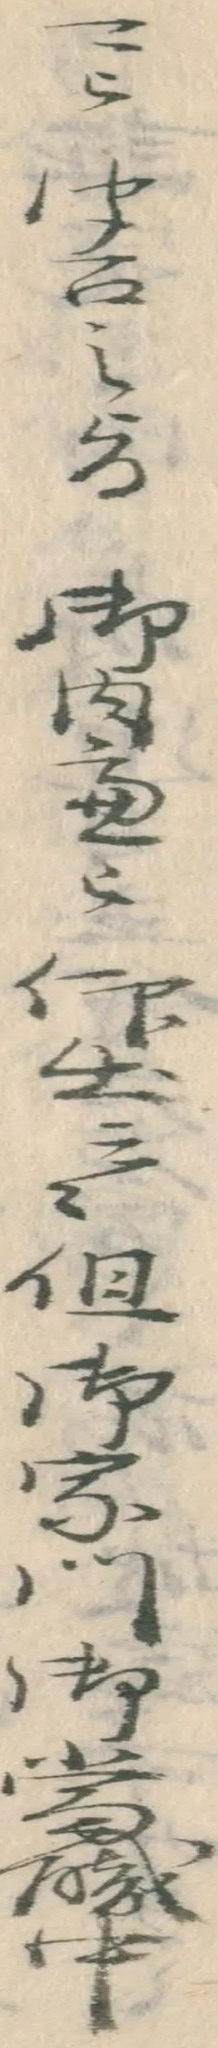可被聞召之旨御内慮被仰出云々但御家門御当職中
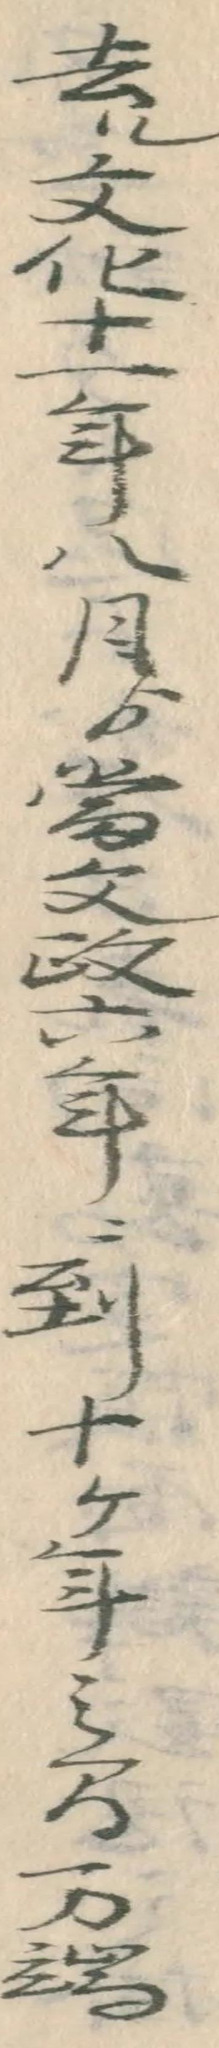去ル文化十一年八月ゟ当文政六年ニ到十ケ年之間万端
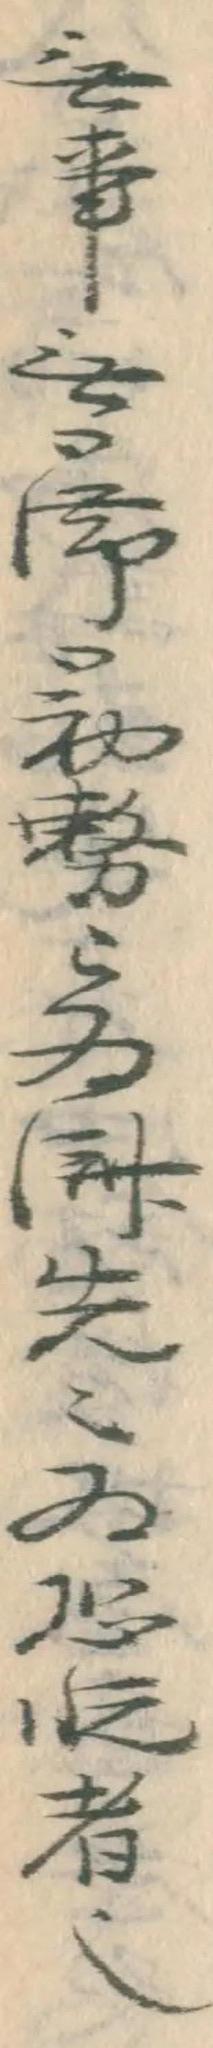無事無御滞御勤務被為済先々為恐悦者也
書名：賀茂社記録. 第64冊
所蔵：国立国会図書館 National Diet Library, JAPAN
